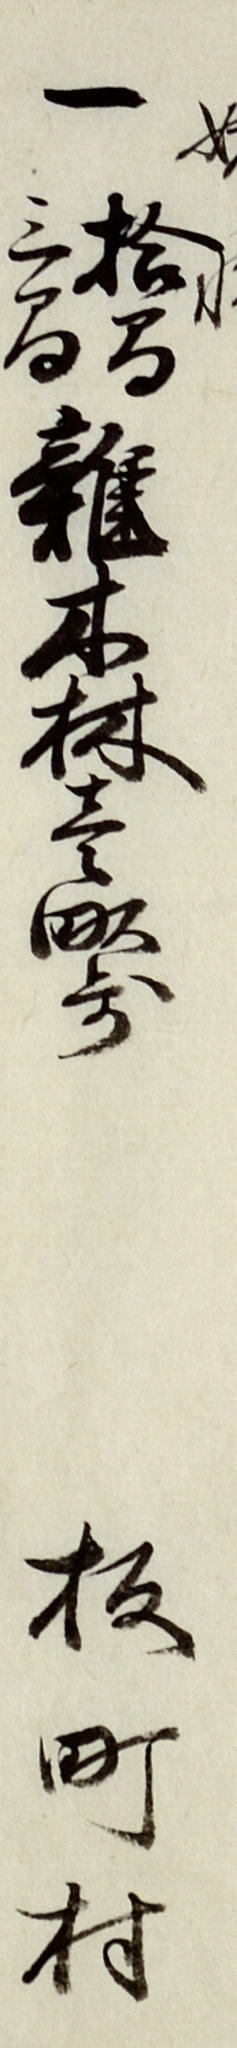一拾間雑木林壱畝歩板町村
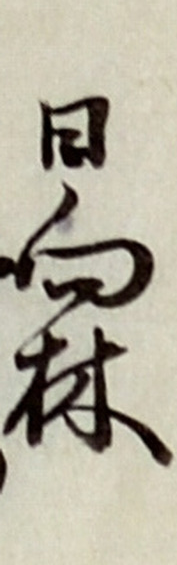日向林
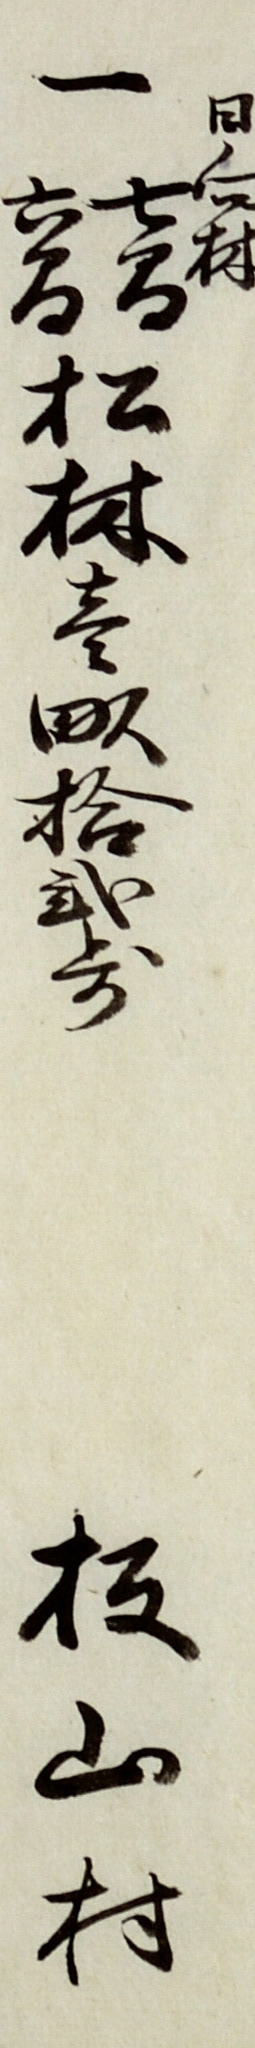一七間松林壱畝拾弐歩板山村
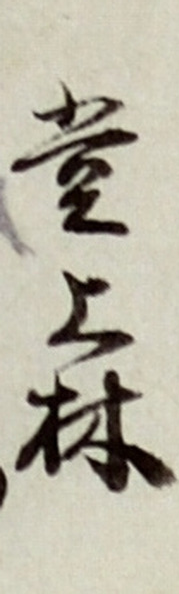堂上林
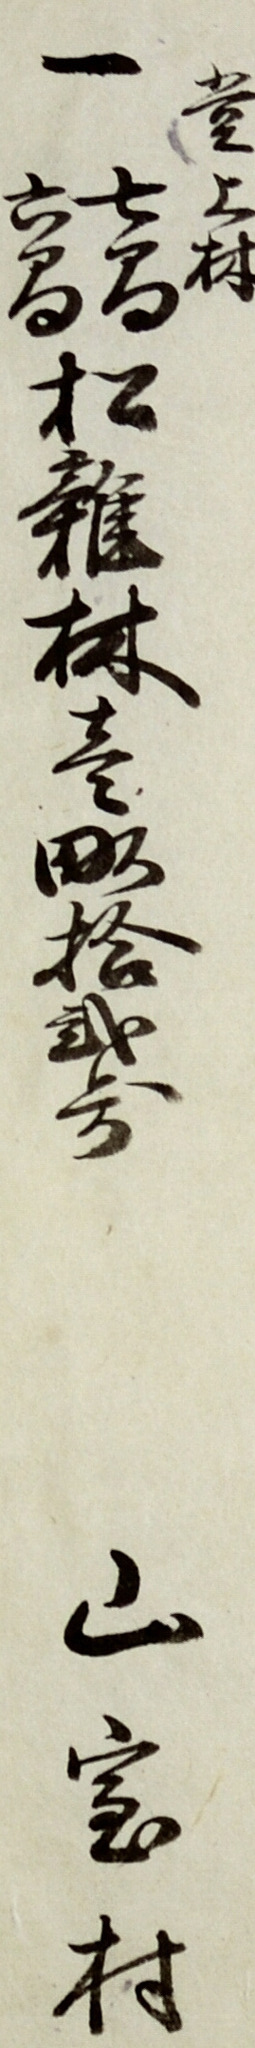一七間松雑木林壱畝拾弐歩山室村

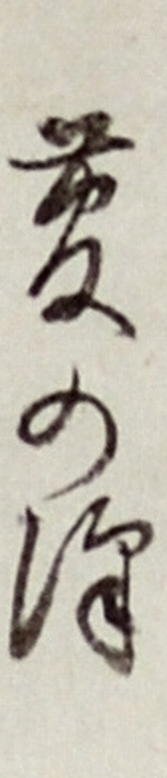菱の沢
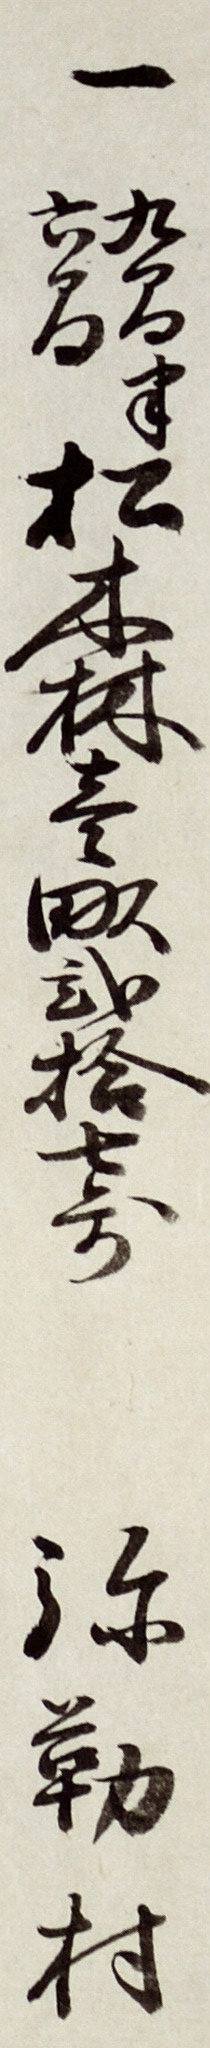一九間半松木林壱畝弐拾七歩弥勒村
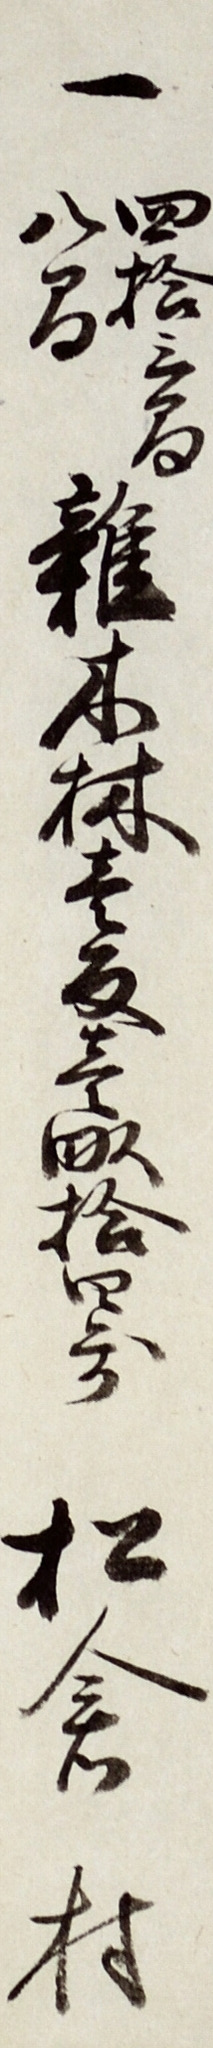一四拾三間雑木林壱反壱畝拾四歩松倉村
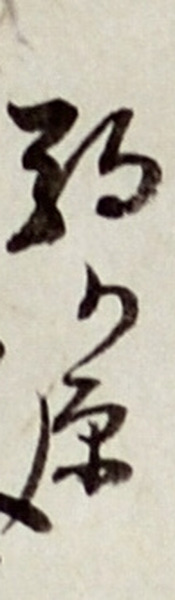駒ケ原
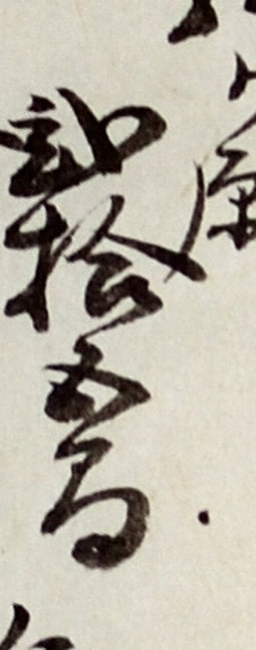弐拾五間
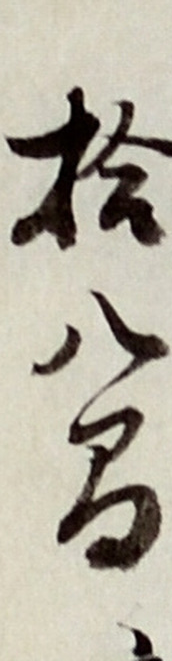拾八間
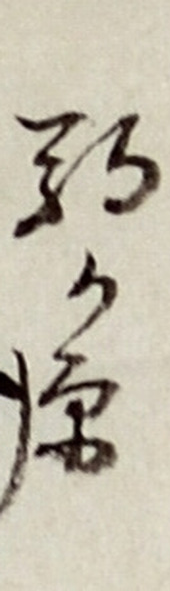駒ケ原
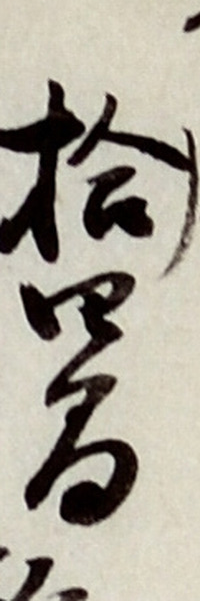拾八間
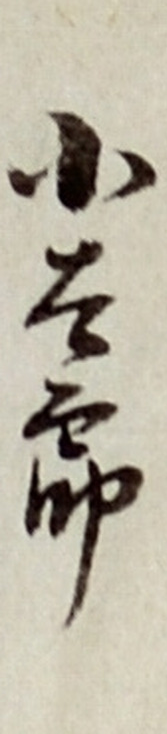小太郎
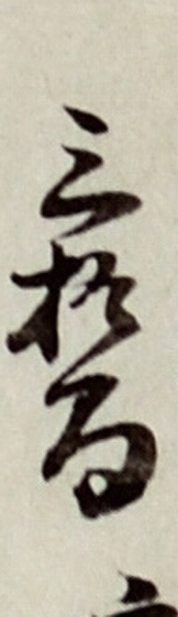三拾間
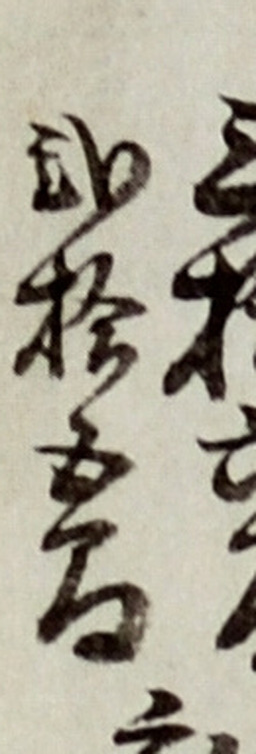弐拾五間
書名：御林御下ケ渡御請印帳
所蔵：伊那市立高遠町図書館・合同会社AMANE
